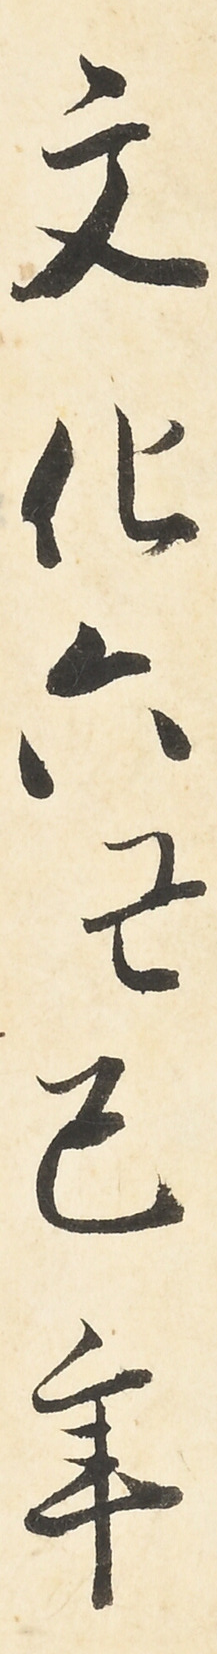文化六己巳年
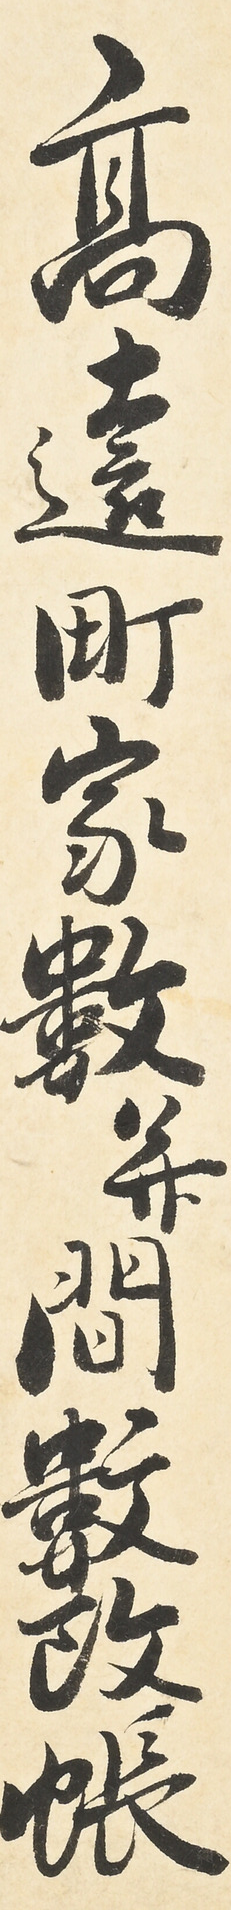高遠町家数并間数改帳

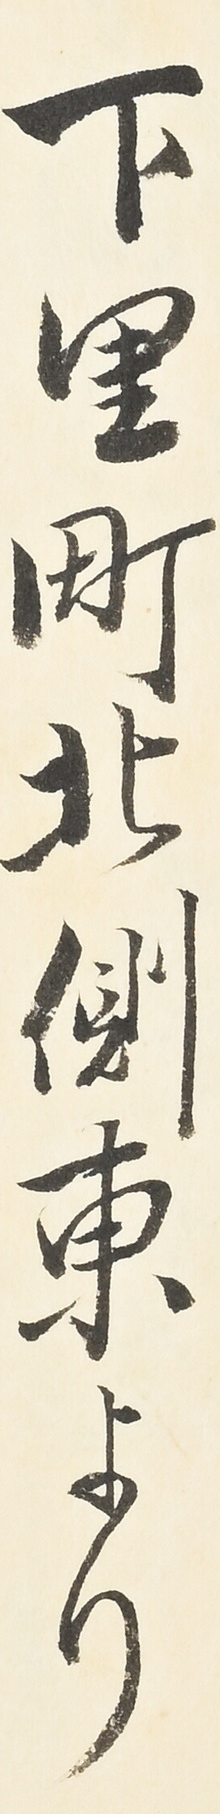下里町北側東より
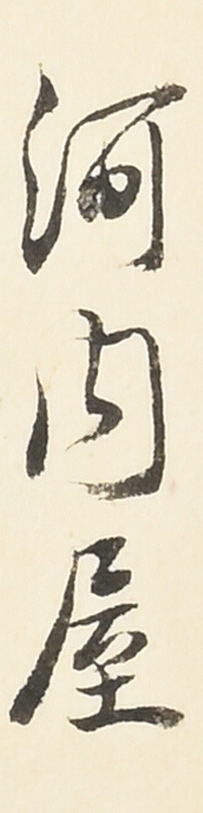河内屋
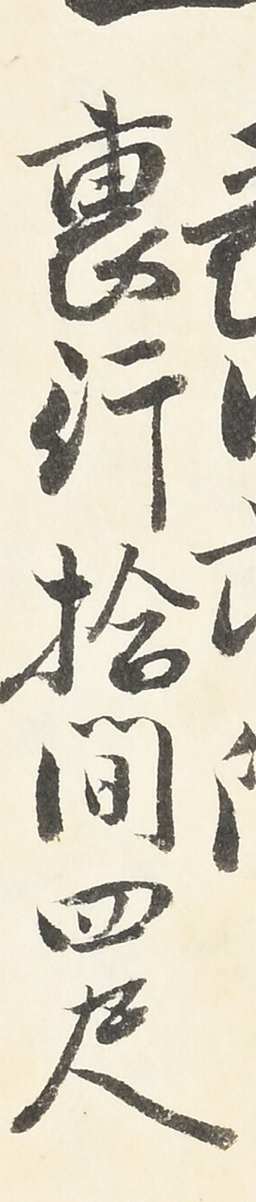裏行四間四尺
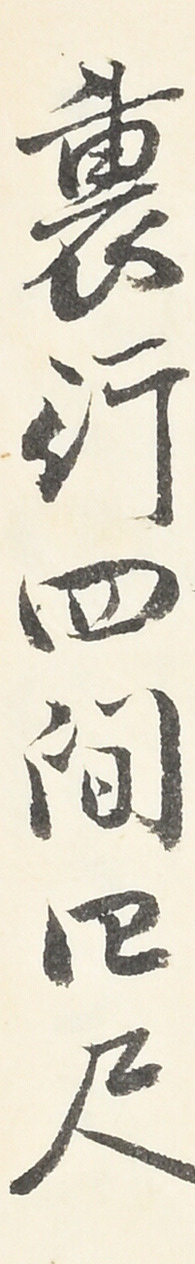裏行四間四尺

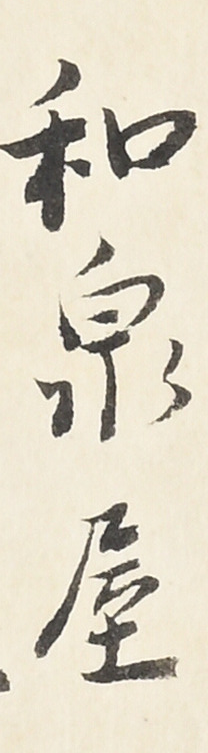和泉屋
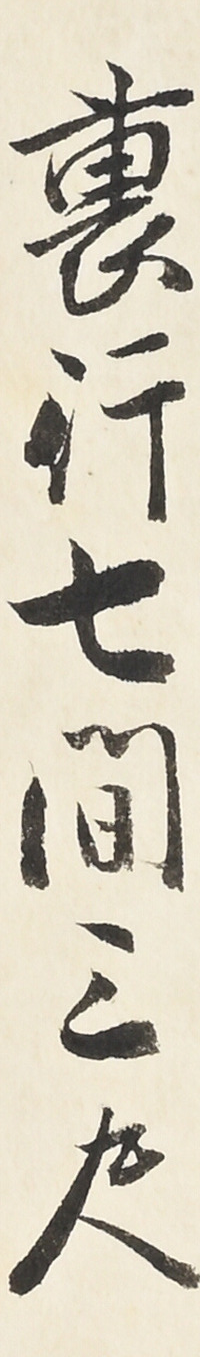裏行七間三尺
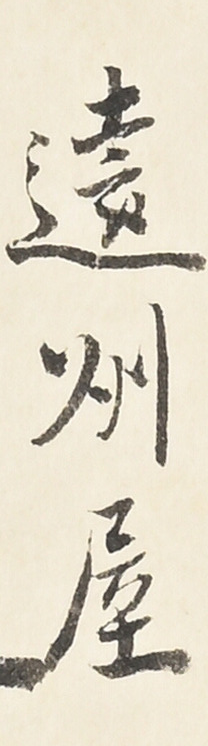遠州屋
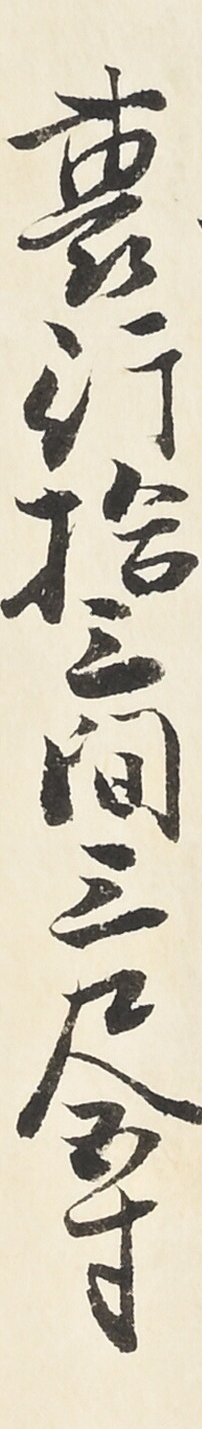裏行拾三間三尺五寸
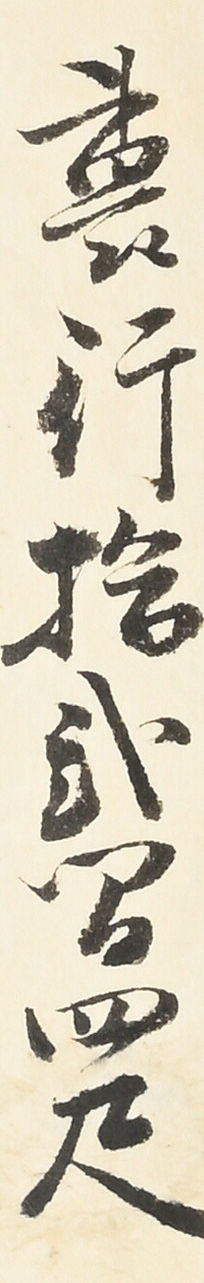裏行拾弐間四尺
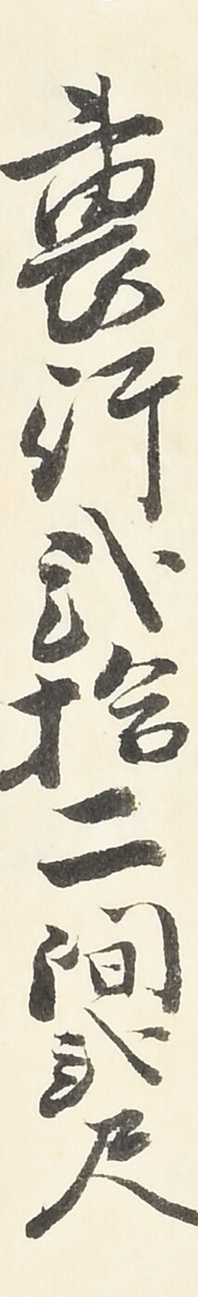裏行弐拾二間弐尺
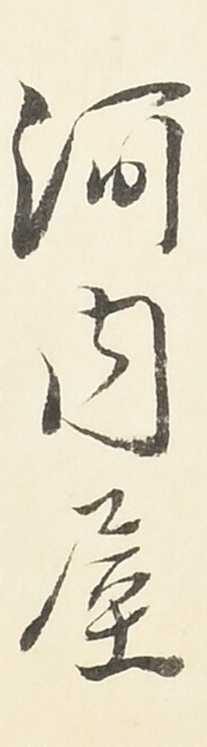河内屋
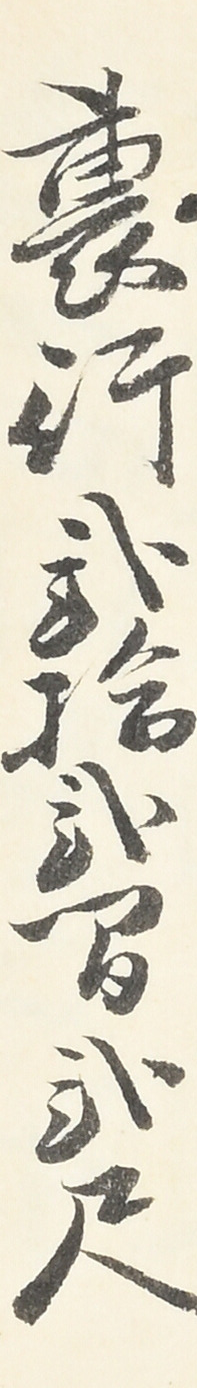裏行弐拾弐間弐尺

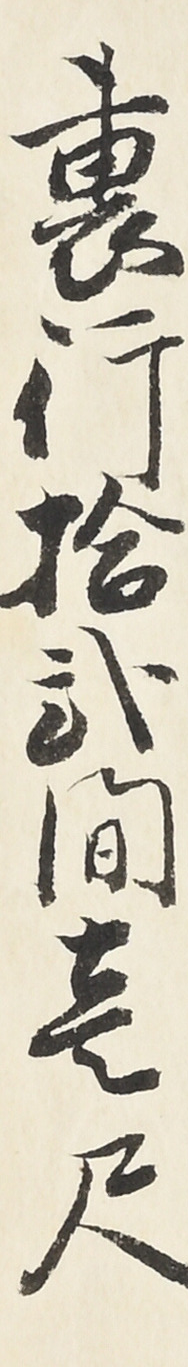裏行拾弐間壱尺
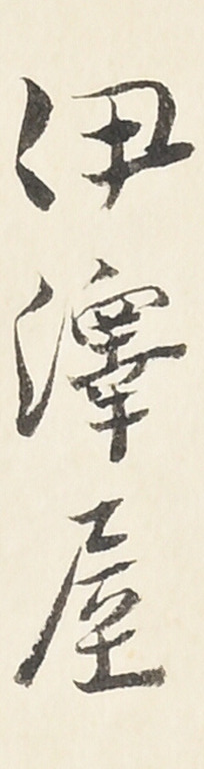伊沢屋
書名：高遠町家数并間数改帳
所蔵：伊那市立高遠町図書館・合同会社AMANE
